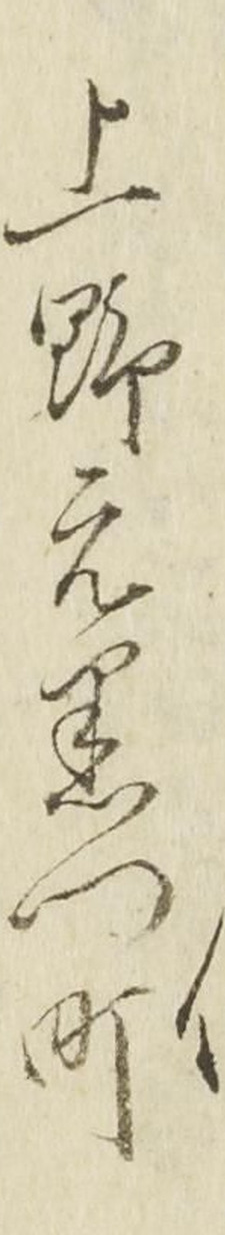上野元黒門町
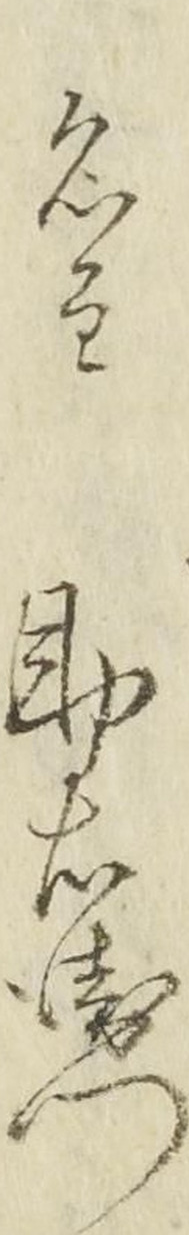名主助右衛門
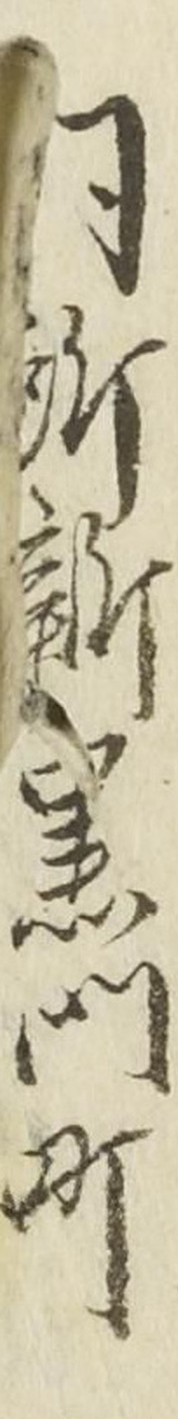同所新黒門町
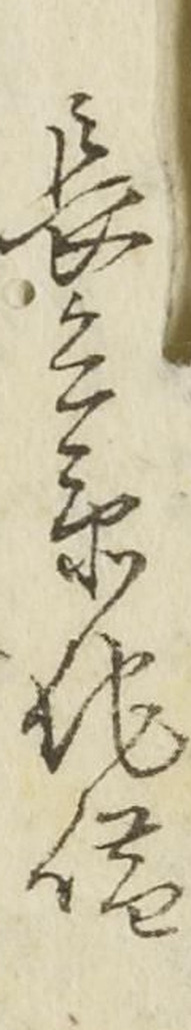長兵衛地借
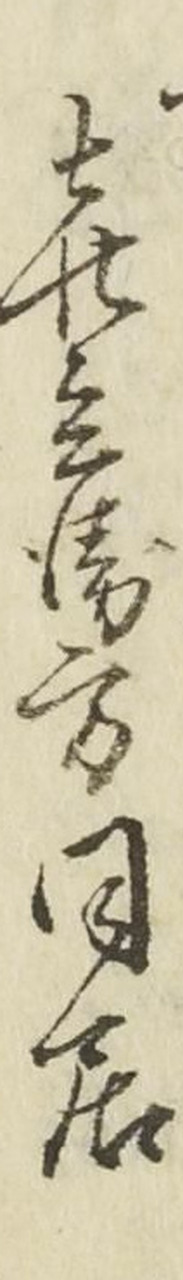喜兵衛方同居
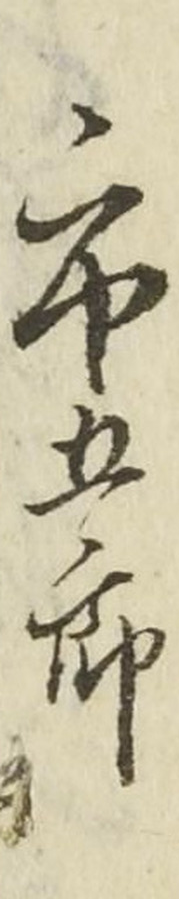市五郎
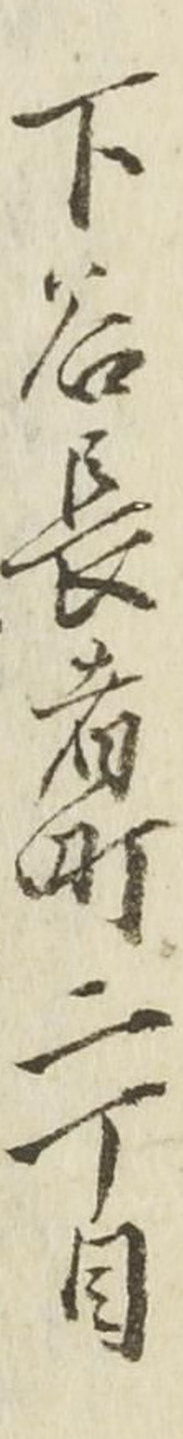下谷長者町二丁目
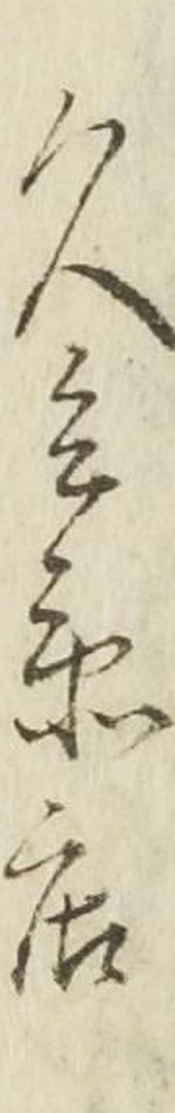久兵衛店
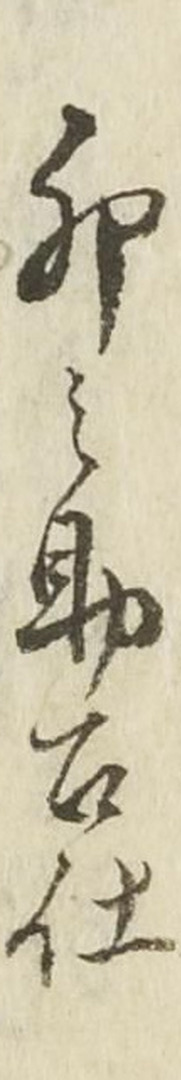卯之助召仕
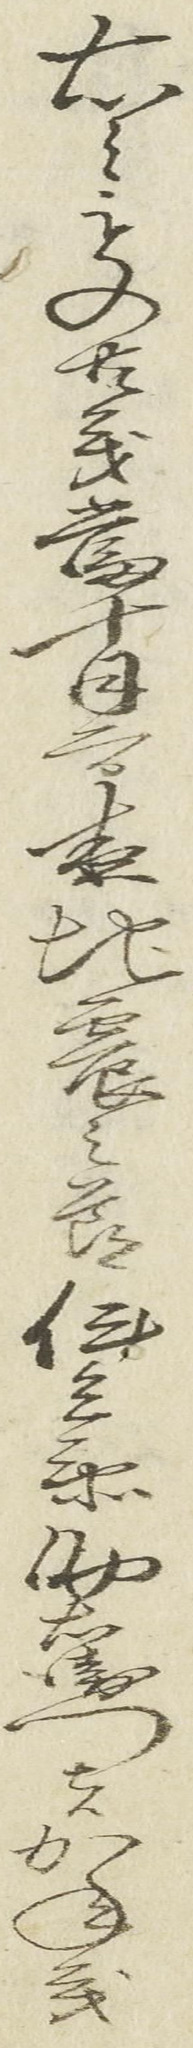右之もの共義当十月二日夜地震之節伊兵衛助右衛門はかね義
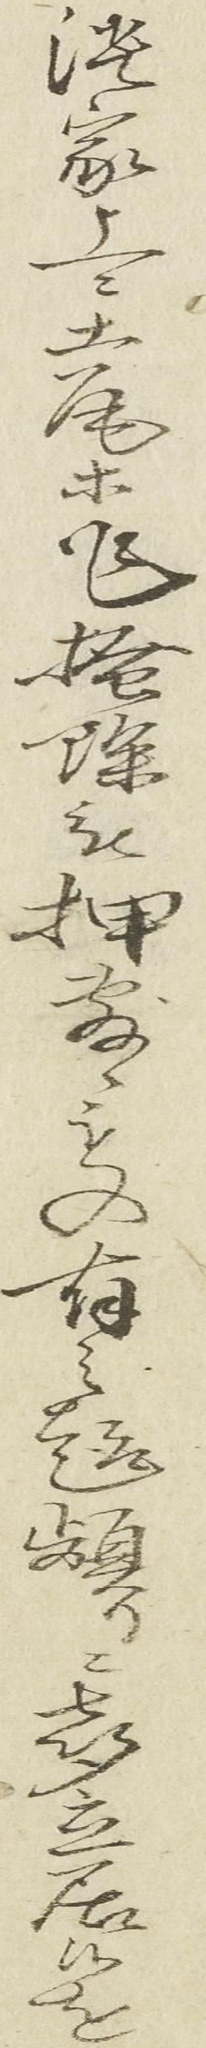潰家上ニ土瓦等乍掻除被押敷候もの有之頻り二声立居候を
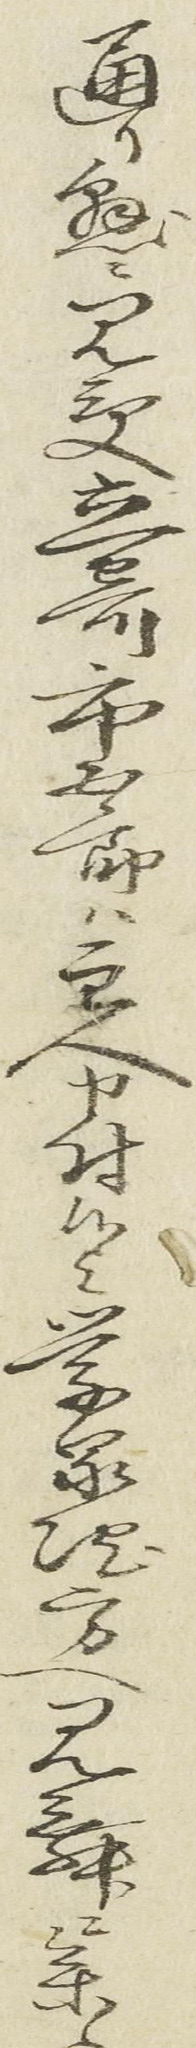通り懸ニ見受立寄市五郎ハ主人申付候と学泉院方へ見舞ニ参候
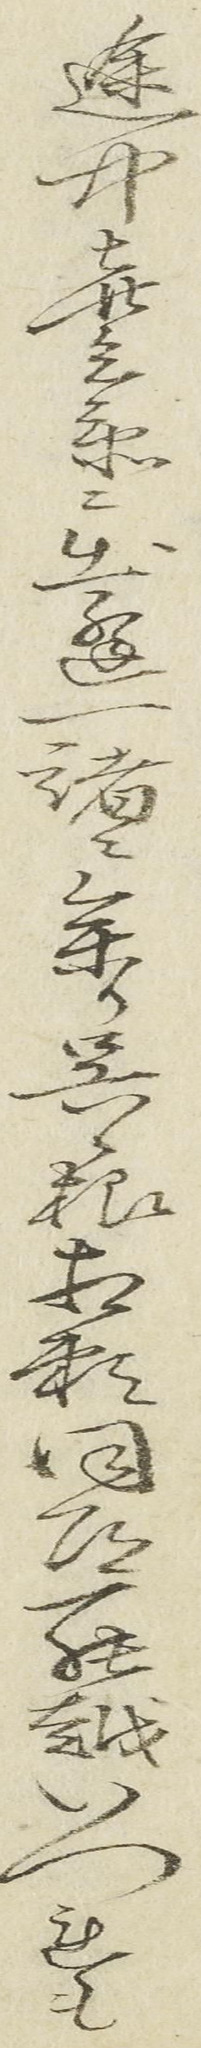途中喜兵衛ニ出逢一緒二参り呉候様相頼同道罷越いつれも
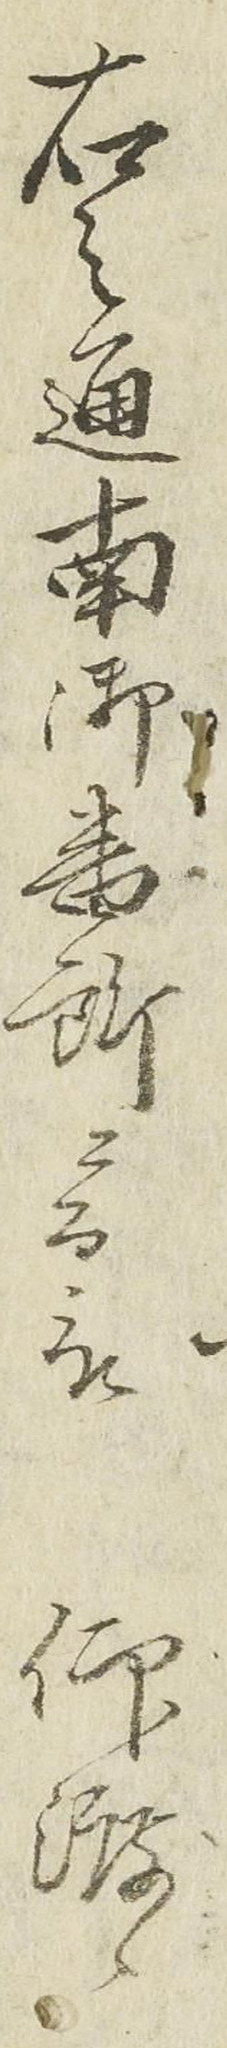右之通南御番所ニ而被仰渡候
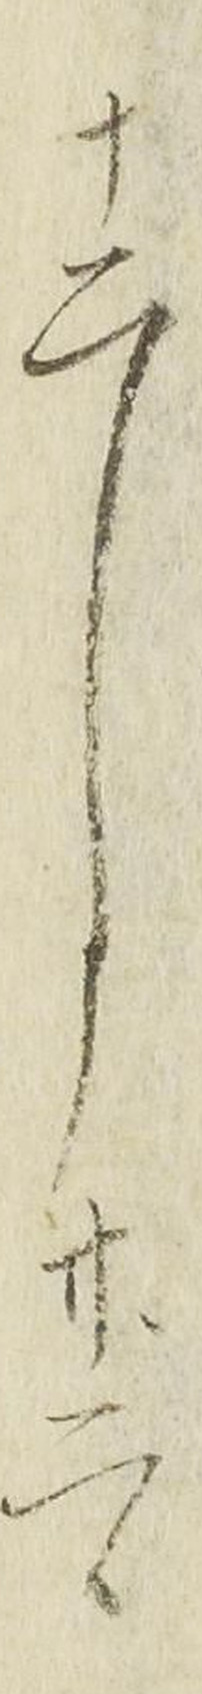十二廿二日

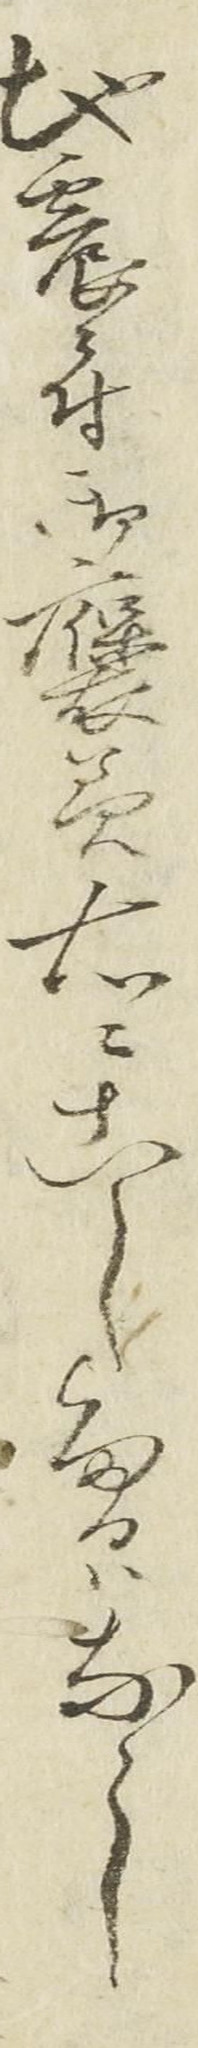地震ニ付御褒美右ニこしたるはなし
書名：安政二乙卯年十月二日大地震之事
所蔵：東京大学地震研究所図書室 Earthquake Research Institute Library, The University of Tokyo, JAPAN
